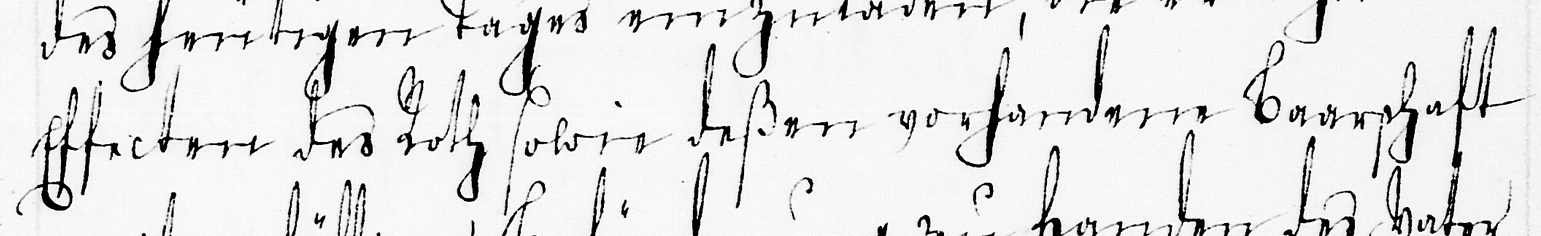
Effecten des Roth sowie deßen vorhandene Baarschaft
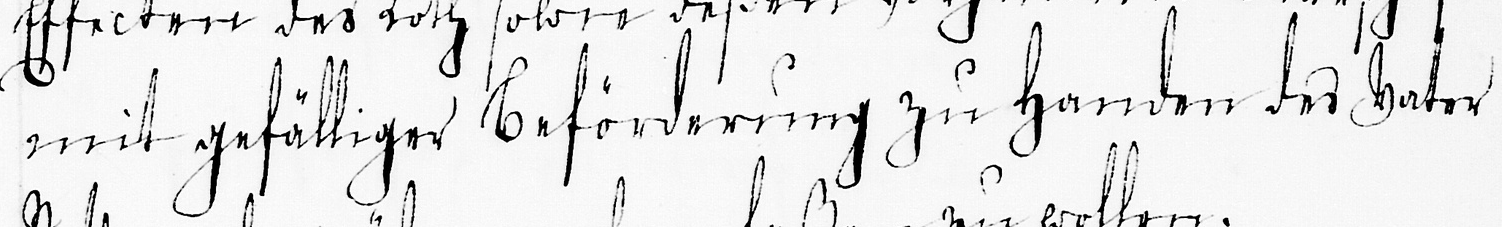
mit gefälliger Beförderung zu Handen des Vater
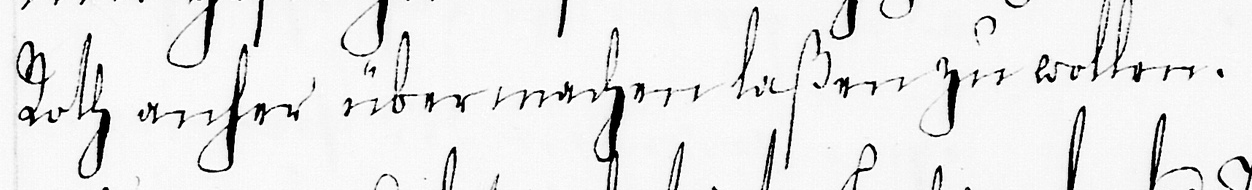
Roth anher übermachen laßen zu wollen.
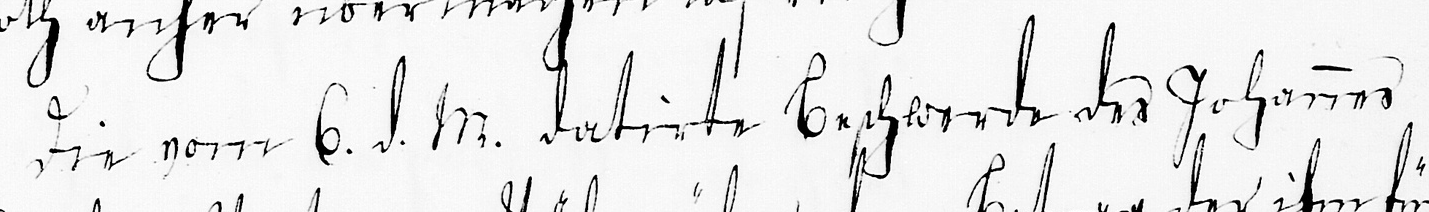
Die vom 6. d. M. datirte Beschwerde des Johannes
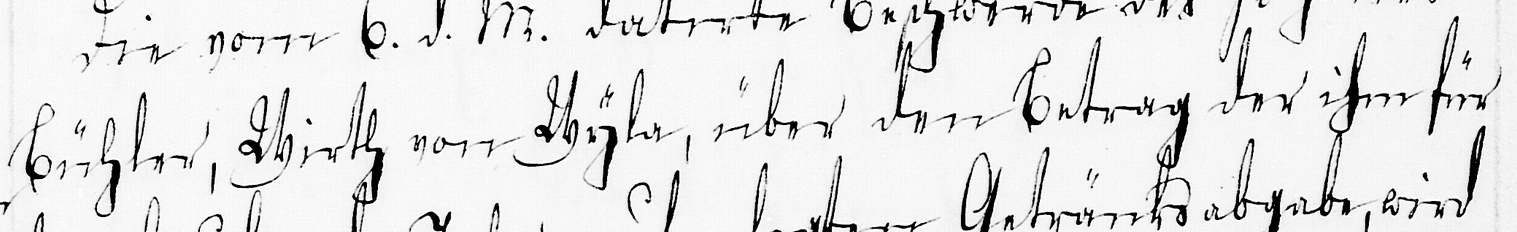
Bühler, Wirth von Wyla, über den Betrag der ihm für
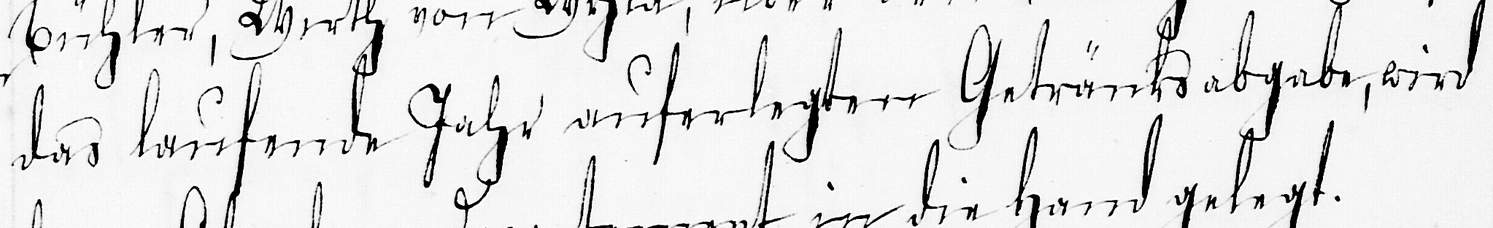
das laufende Jahr auferlegten Getränksabgabe, wird
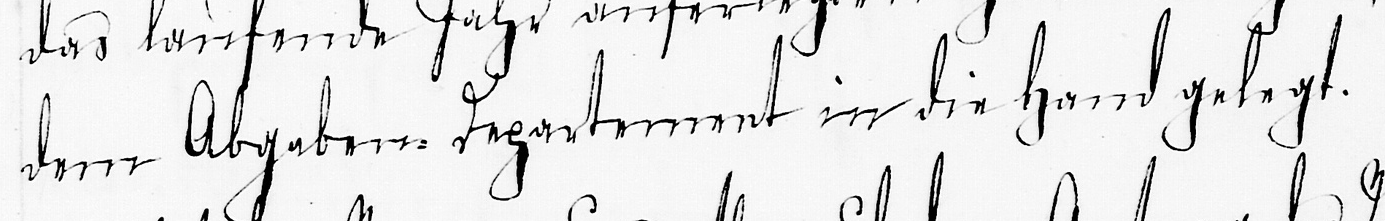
dem Abgaben-Departement in die Hand gelegt.
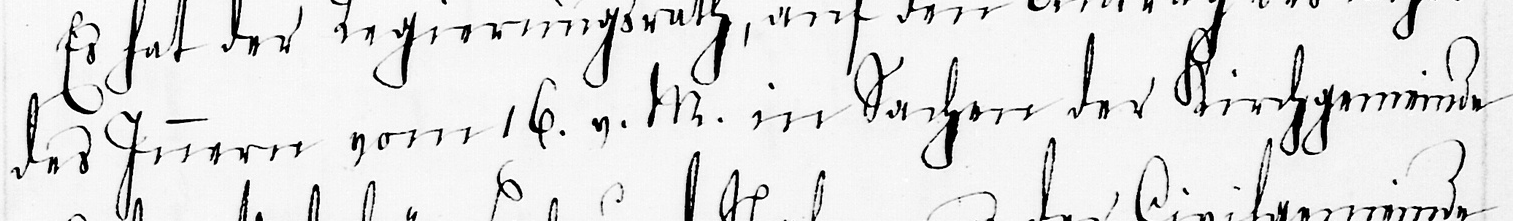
des Innern vom 16. v. M. in Sachen der Kirchgemeinde
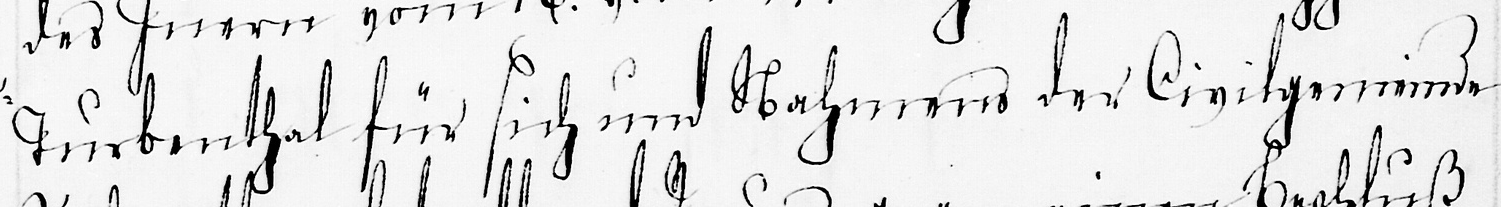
Turbenthal für sich und Nahmens der Civilgemeinde
